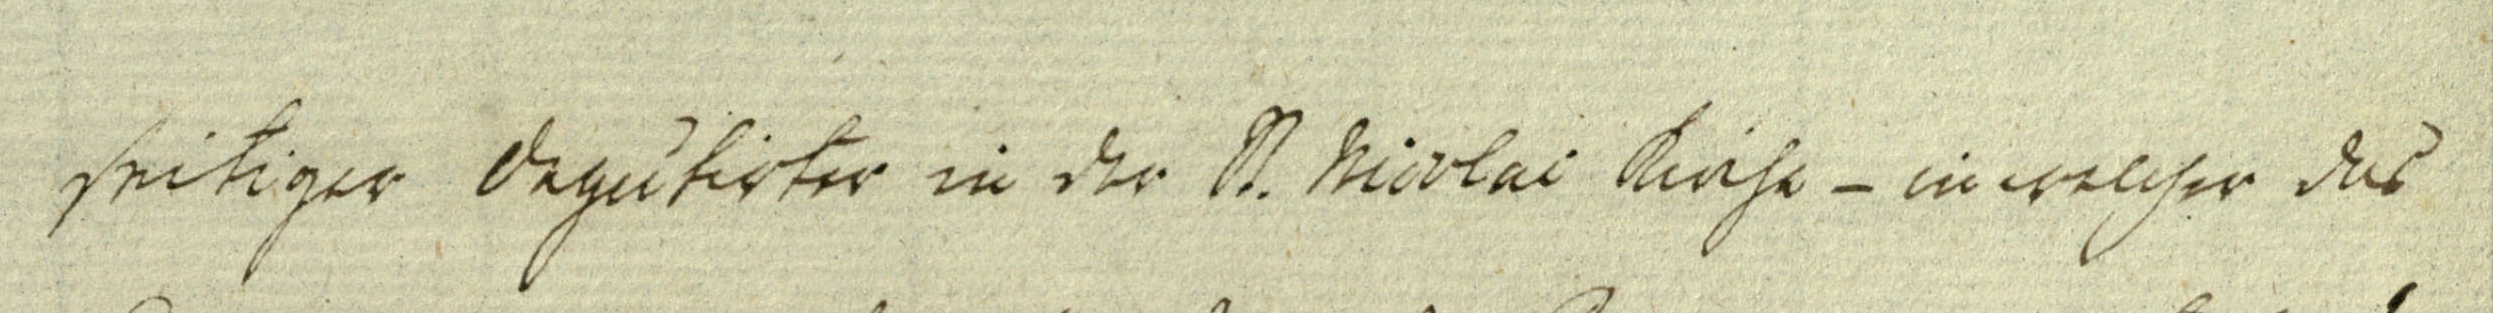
seitiger Deputirter in der St. Nicolai Kirche - in welcher das
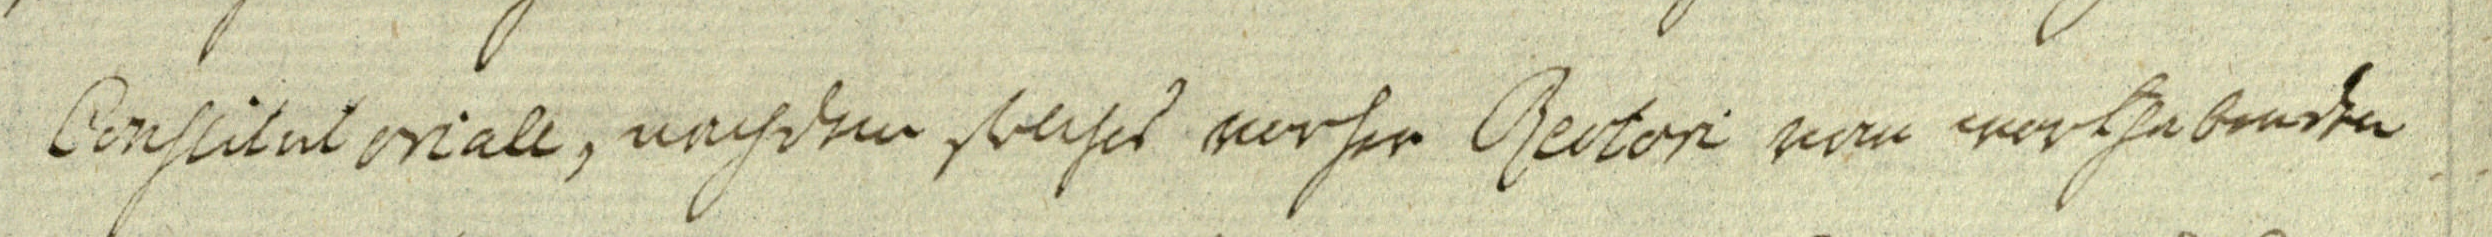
Constitutoriale, nachdem solches vorher Rectori vom worthabenden
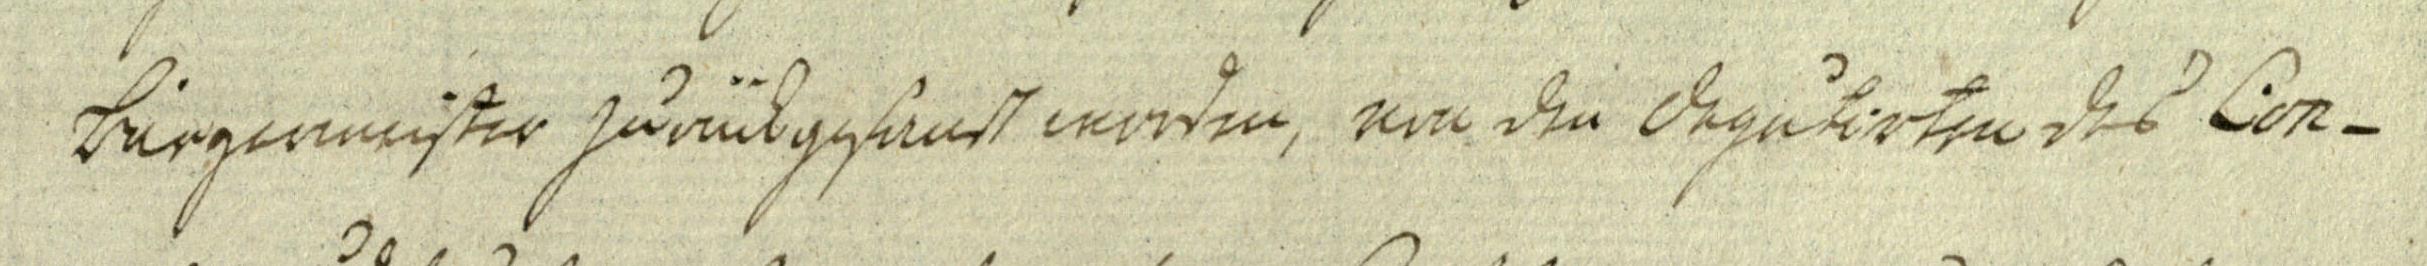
Bürgermeister zurückgesandt worden, von den Deputirten des Con¬
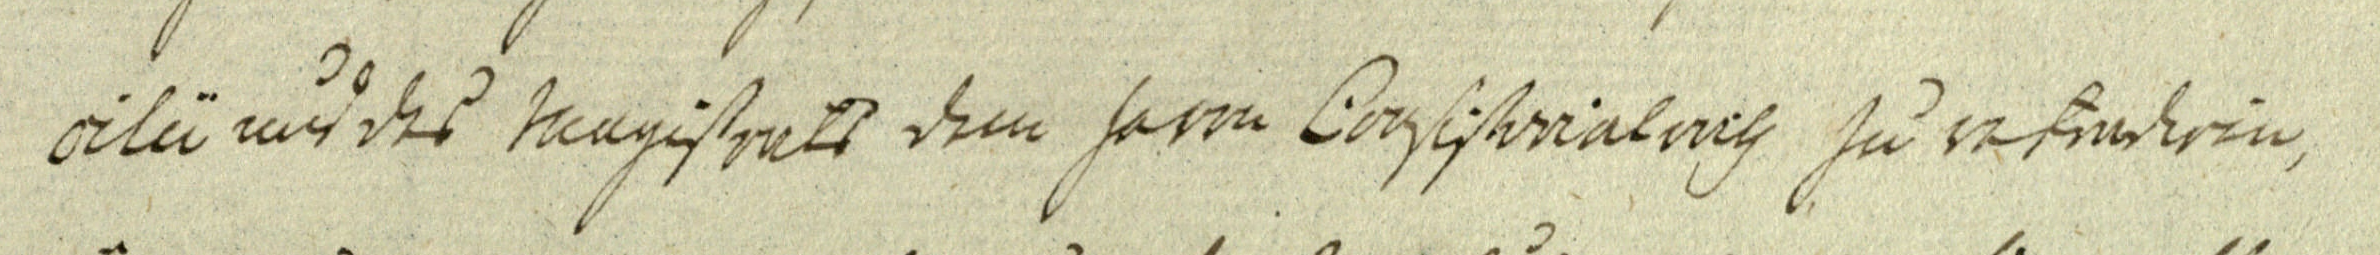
cilii und des Magistrats dem Herrn Consistorialrath zu retradiren,
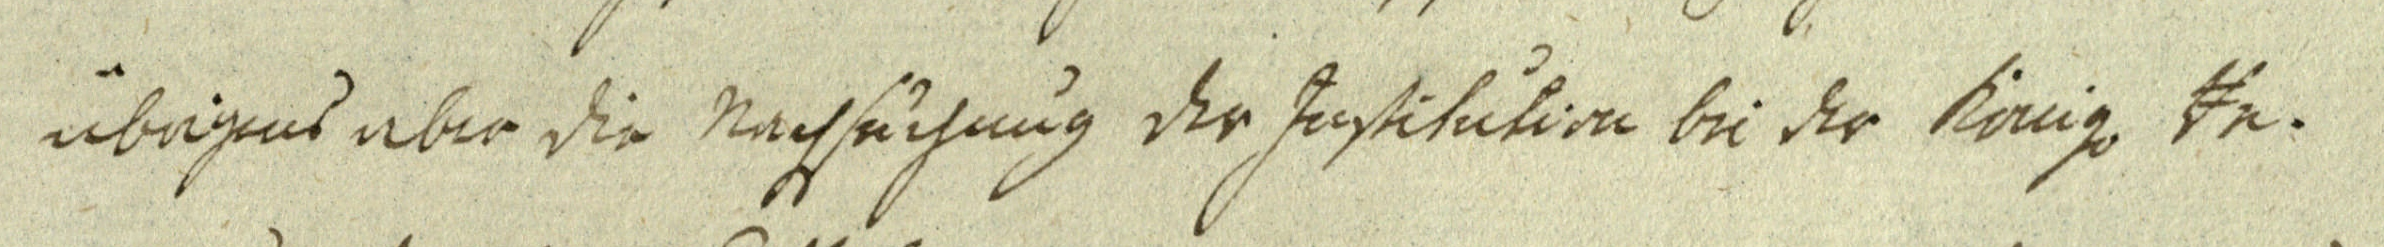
übrigens aber die Nachsuchung der Institution bei der König. Re¬
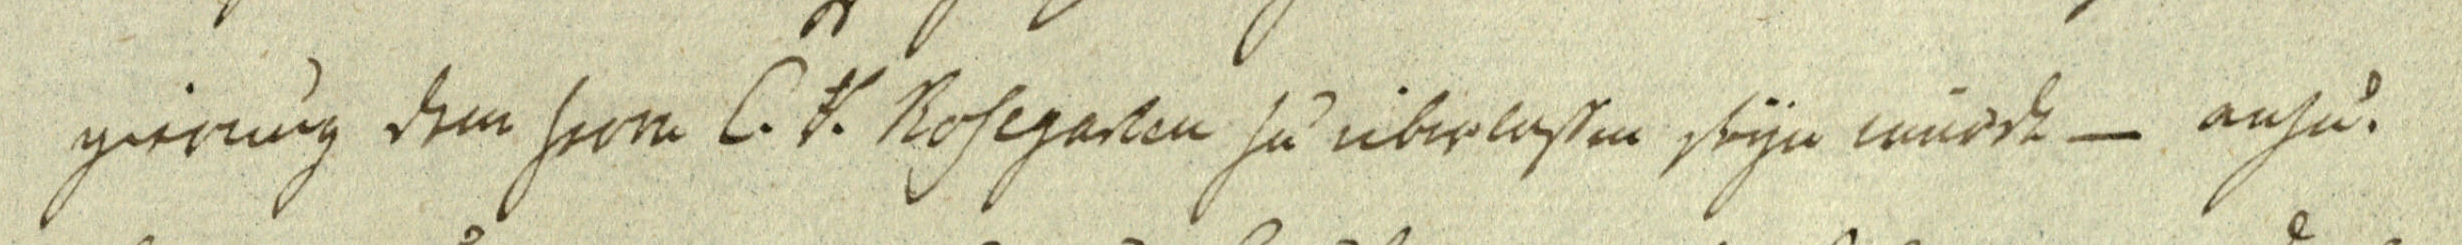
gierung dem Herrn C. R. Kosegarten zu überlassen seÿn würde - auszu¬
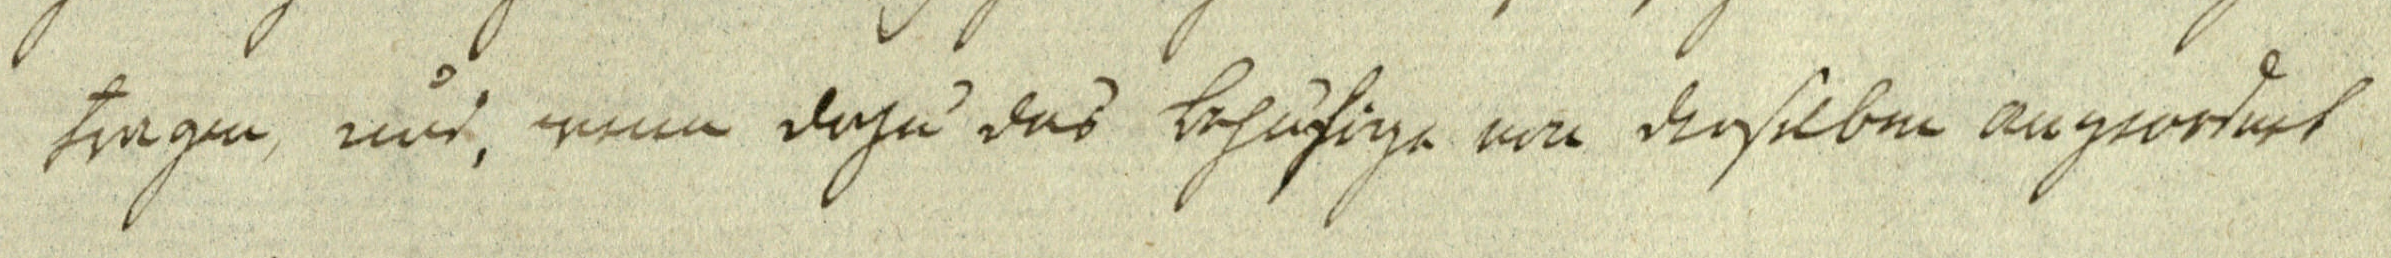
tragen, und, wenn dazu das Behufige von derselben angeordnet
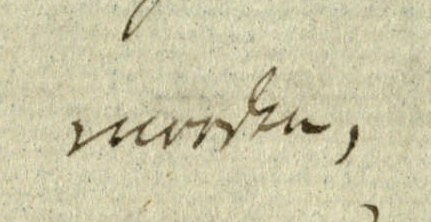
worden,
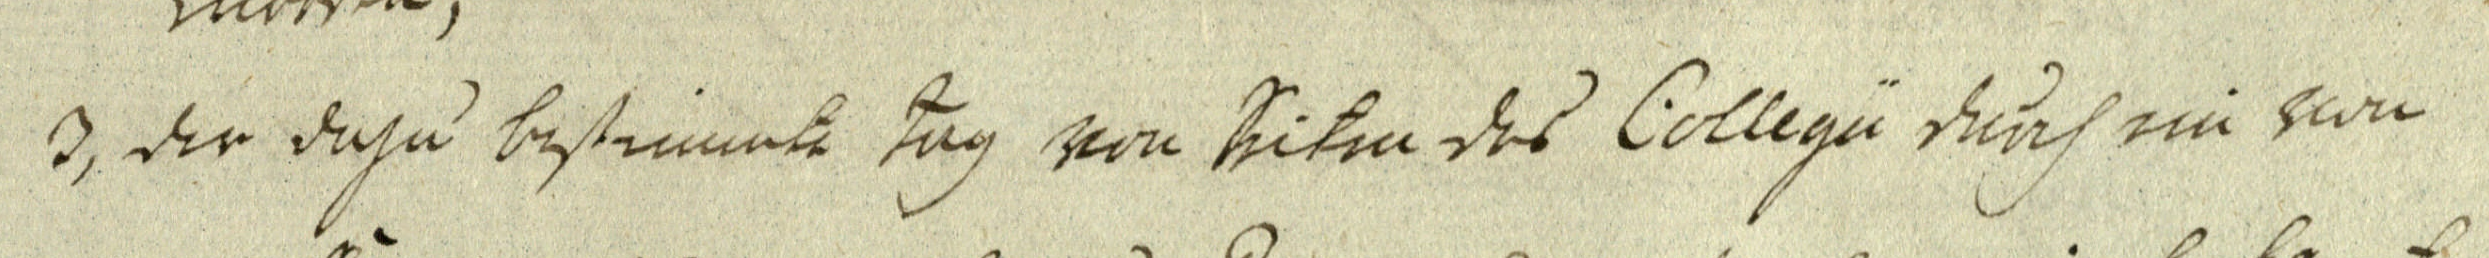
3, der dazu bestimmte Tag von Seiten des Collegii auch ein von
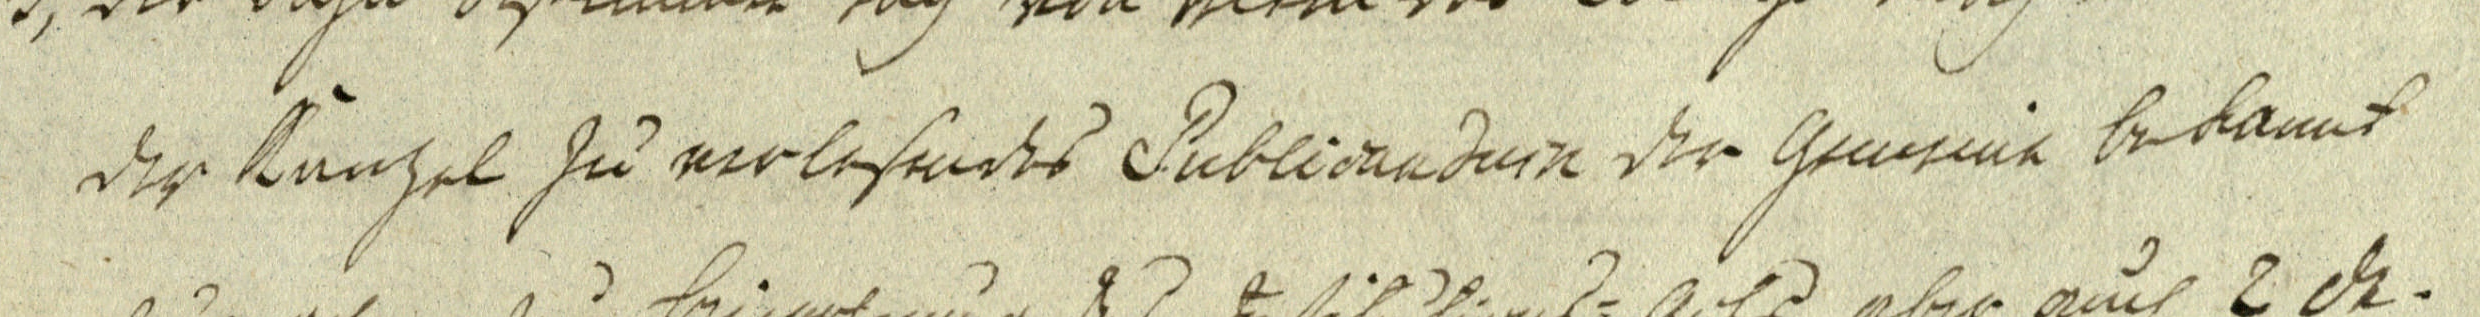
der Kanzel zu verlesendes Publicandum der Gemeine bekannt
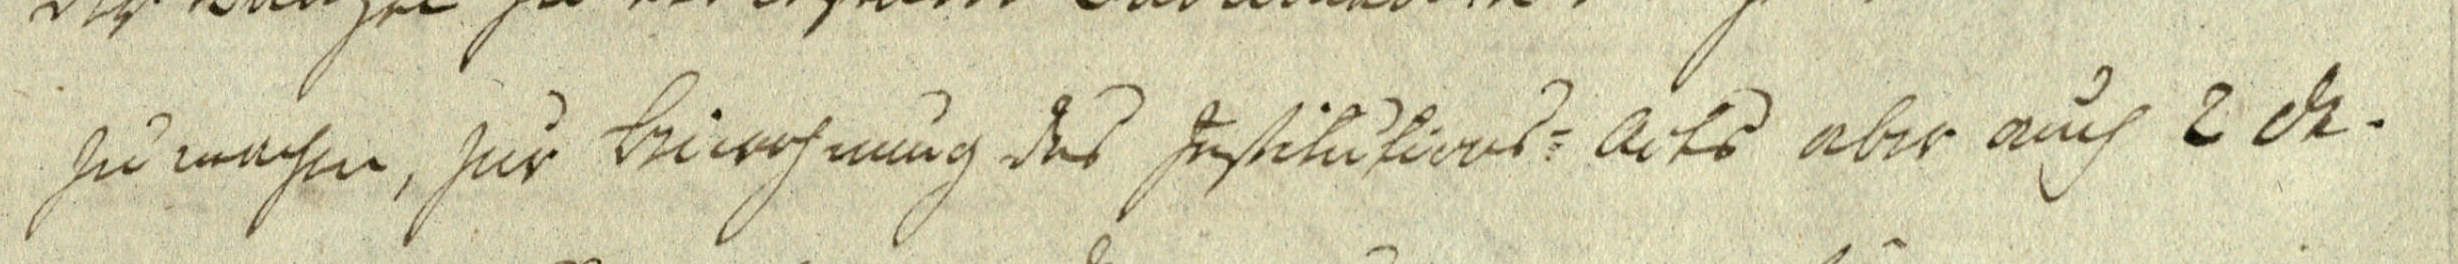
zu machen, zur Beiwohnung des Institutions- Acts aber auch 2 De¬
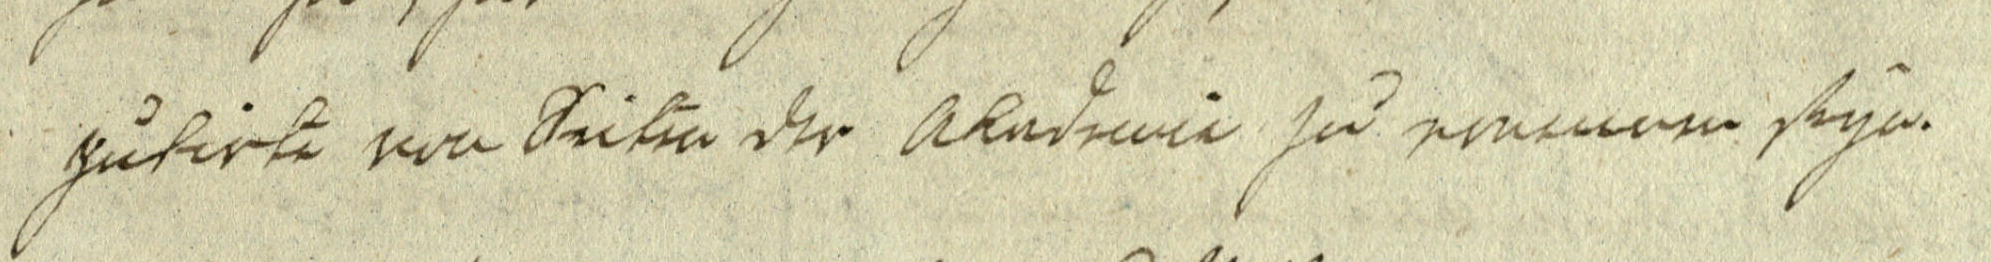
putirte von Seiten der Akademie zu ernennen seÿn.
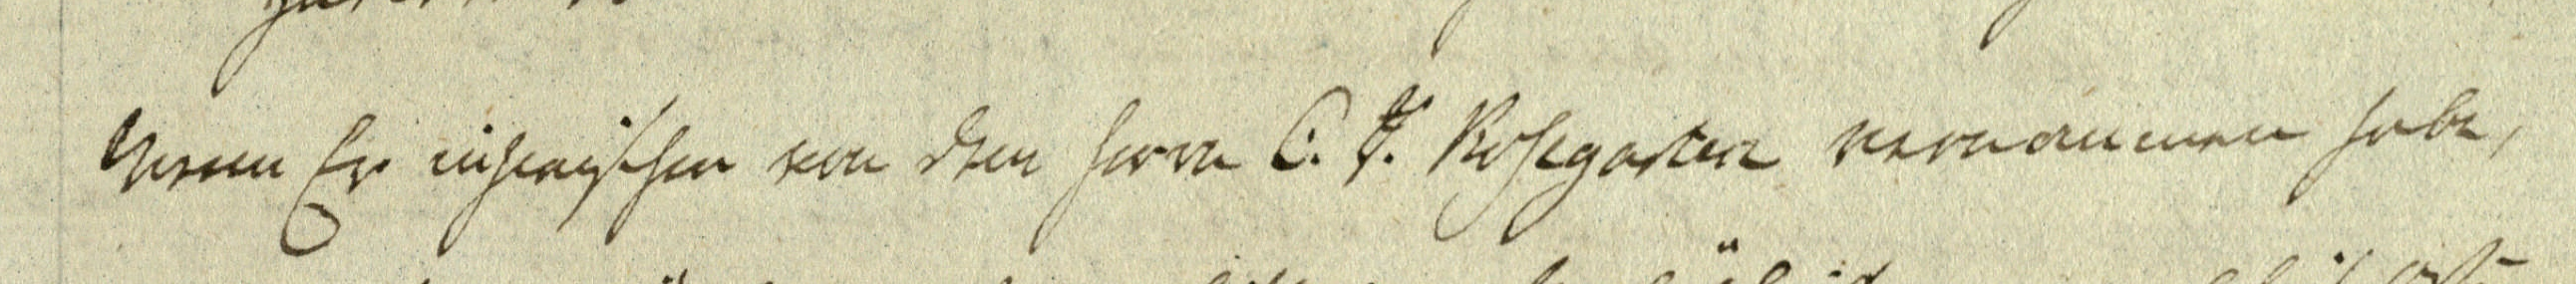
Wenn Er inzwischen von dem Herrn C. R. Kosegarten vernommen habe,
